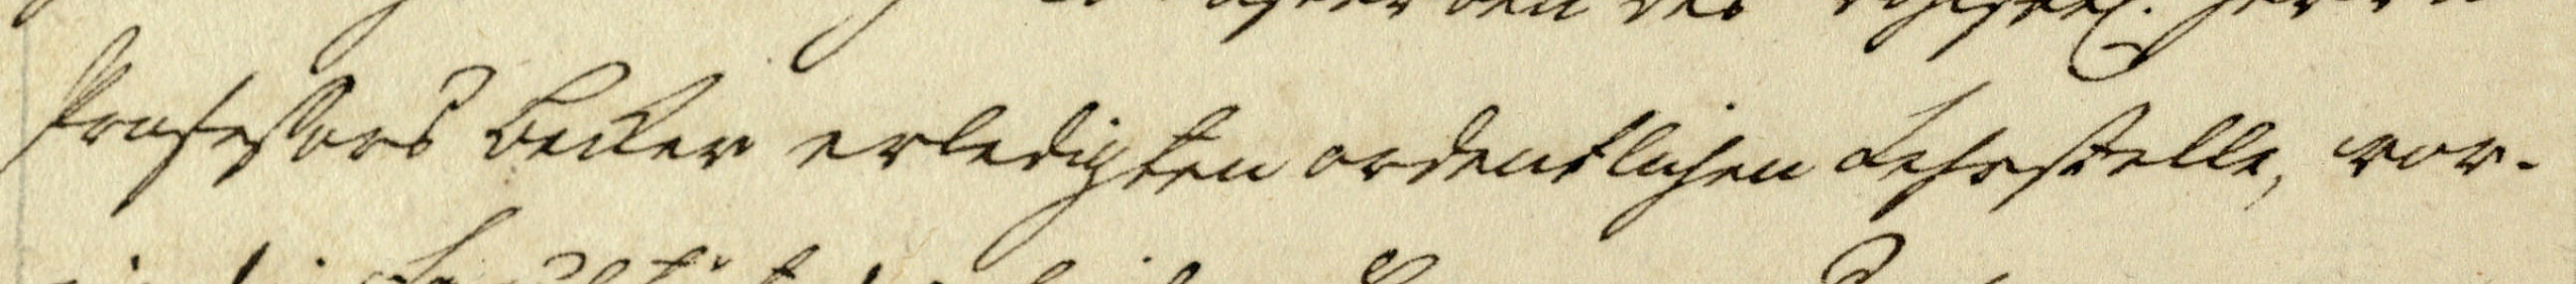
Professors Becker erledigten ordentlichen Lehrstelle, wor¬
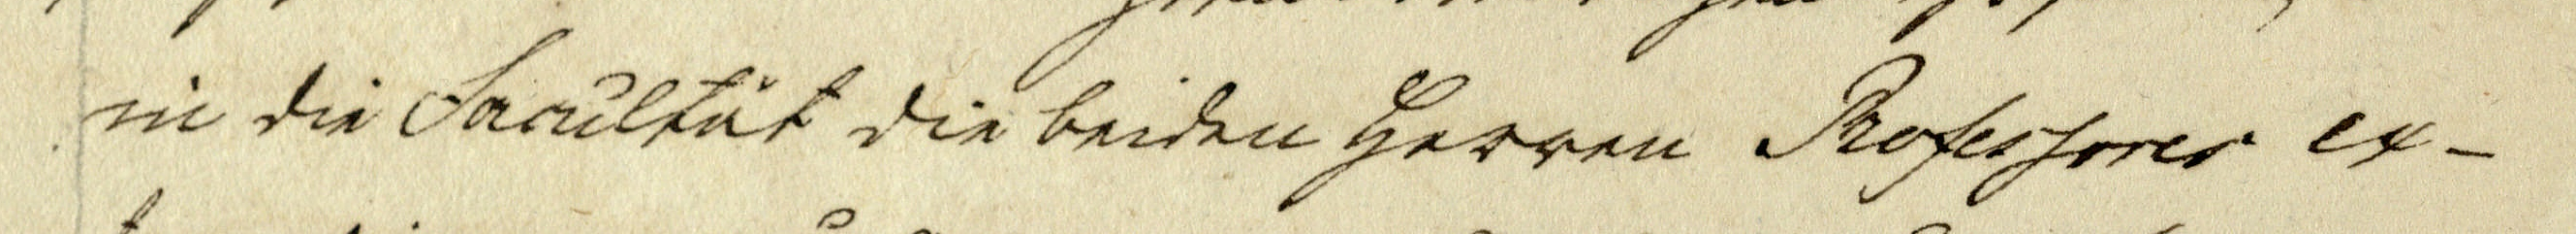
in die Facultät die beiden Herren Professores ex¬
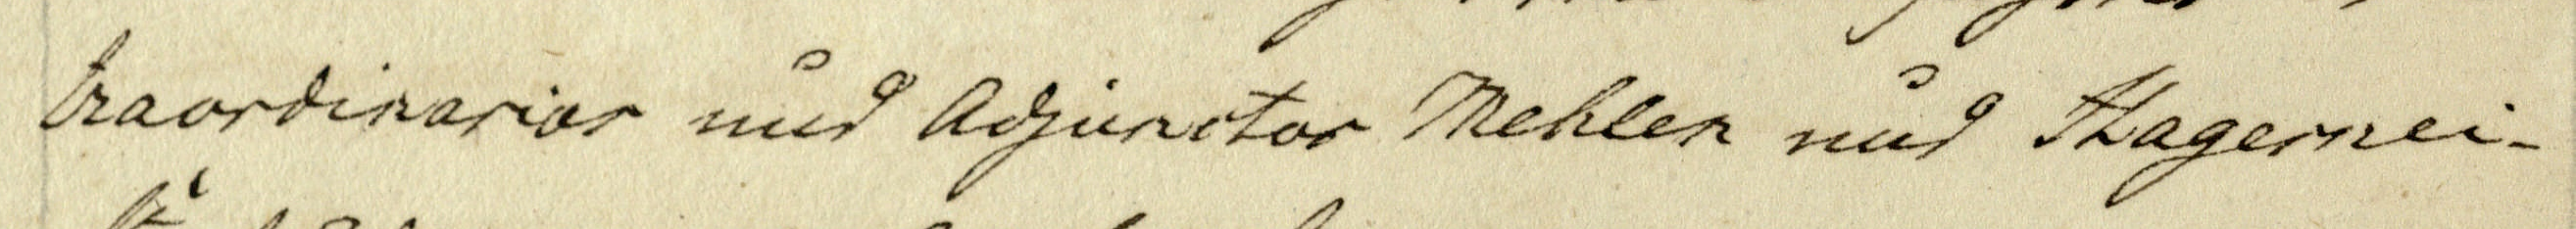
traordinarios und Adjunctos Mehlen und Hagemei¬
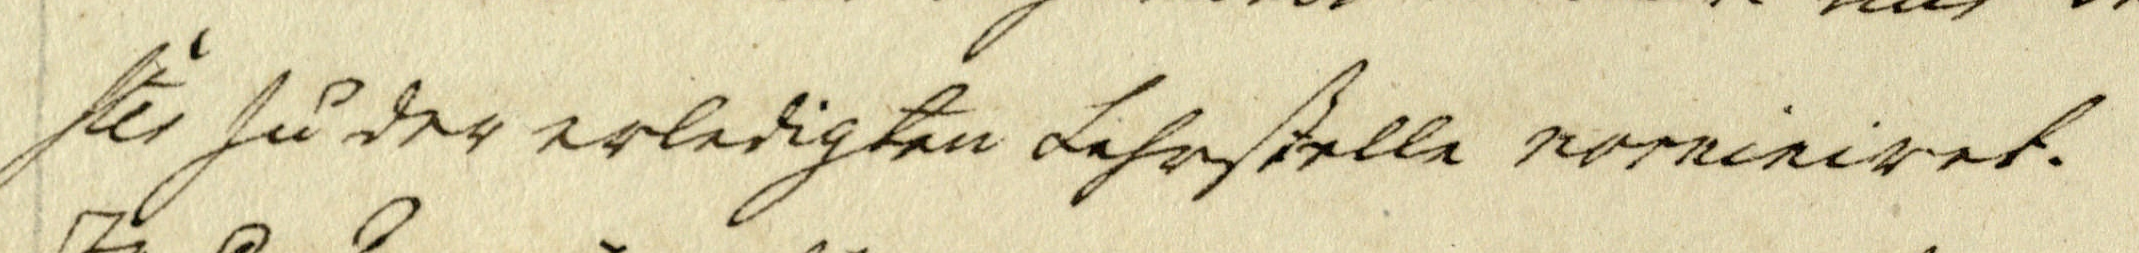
ster zu der erledigten Lehrstelle nominiret.
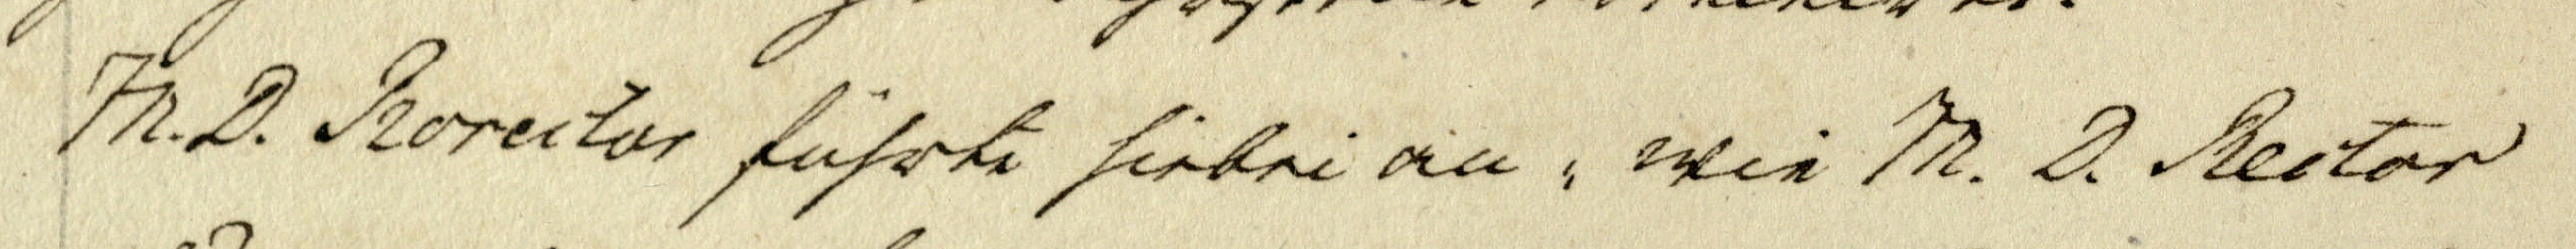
M. D. Prorector führte hiebei an: wie M. D. Rector
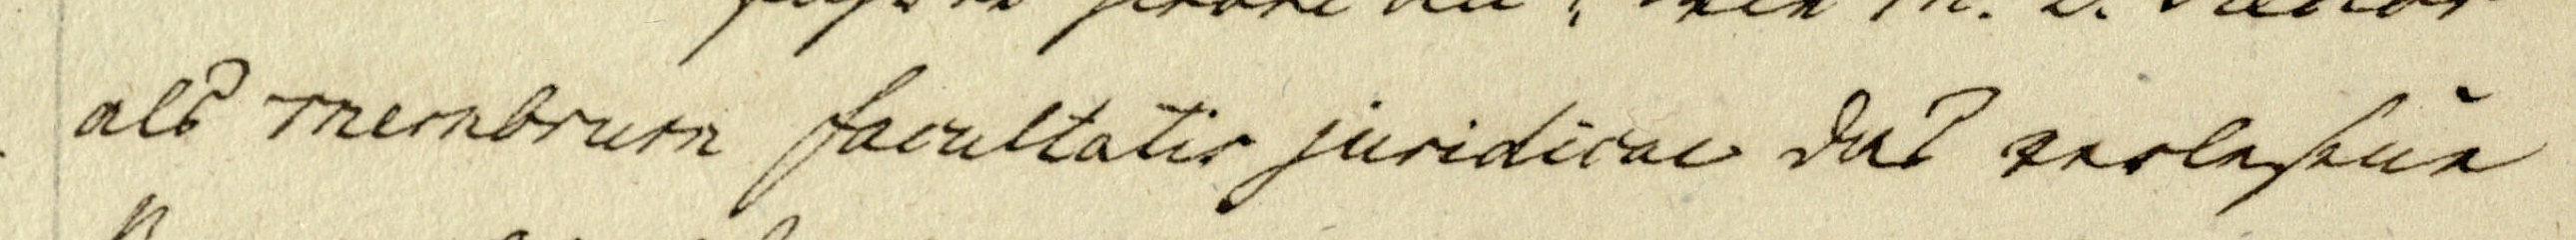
als membrum Facultatis juridicae das verlesene
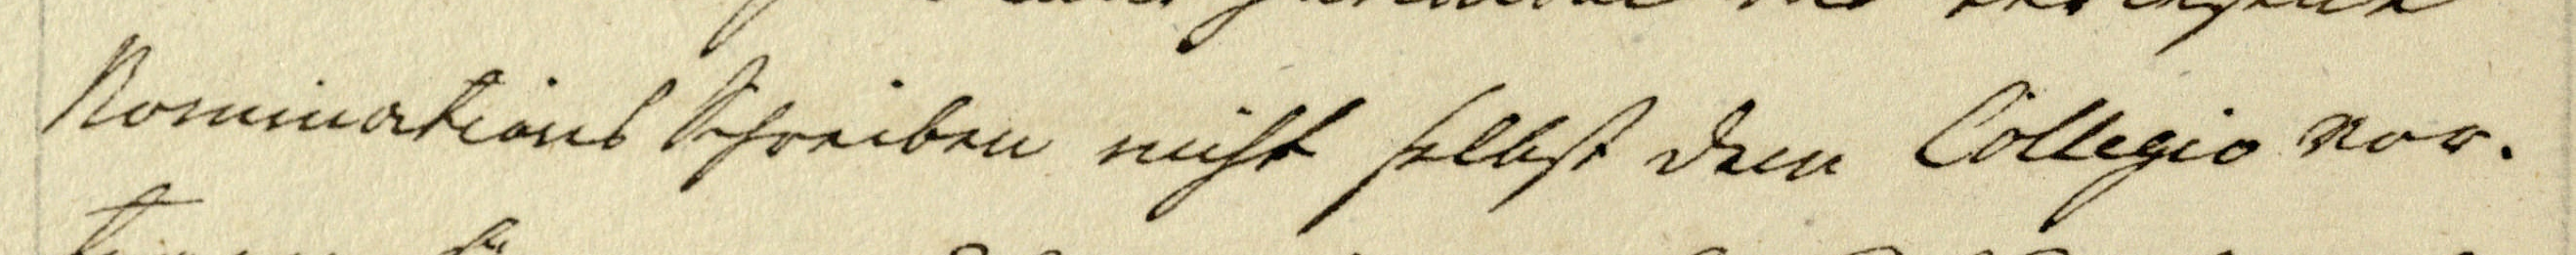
Nominations Schreiben nicht selbst dem Collegio vor¬
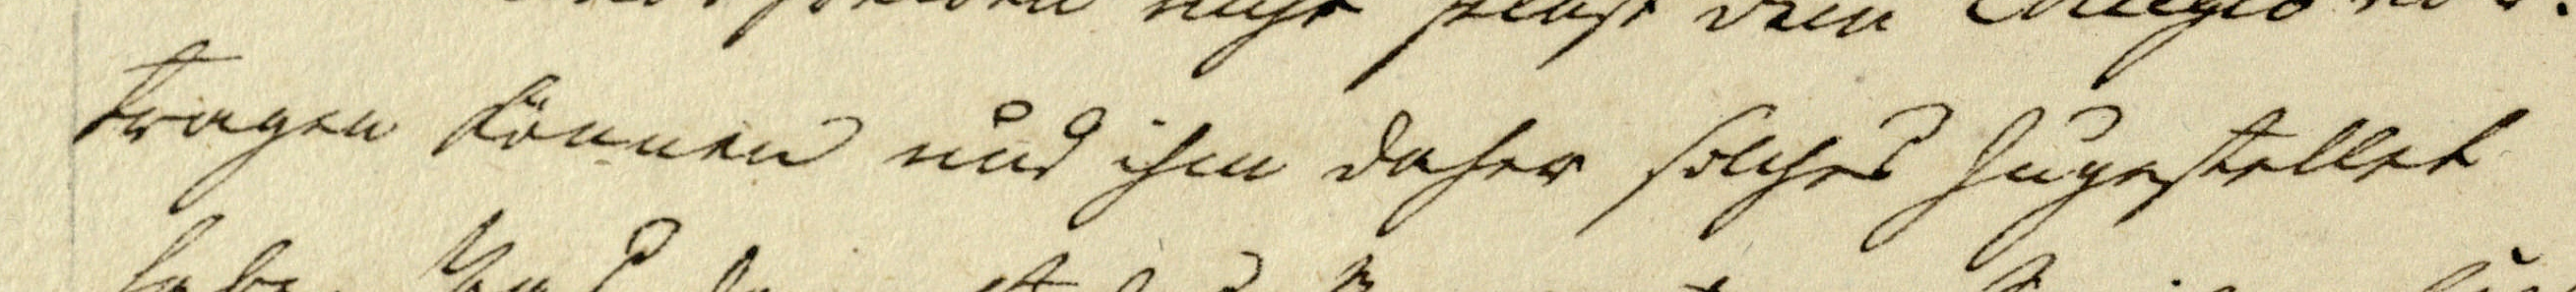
tragen können und ihm daher solches zugestellet
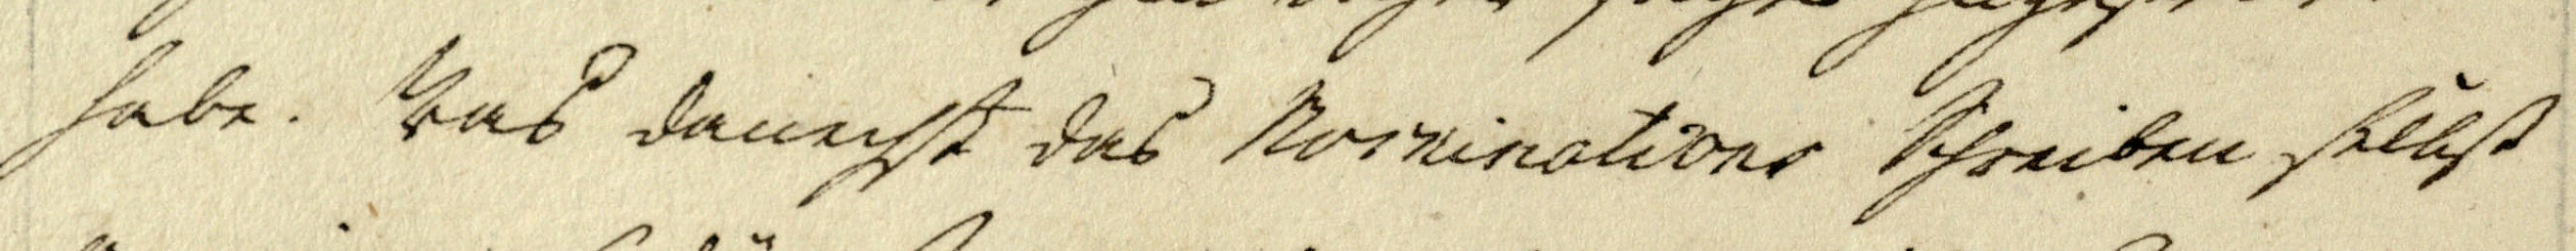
habe. Was danechst das Nominations Schreiben selbst
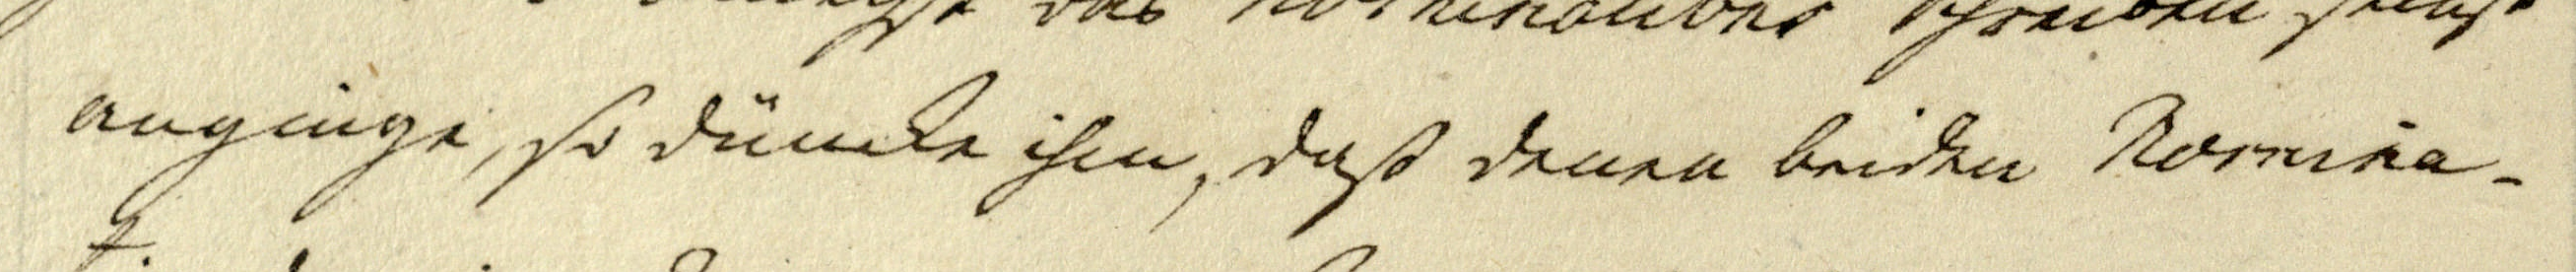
anginge, so düncke ihm, daß denen beiden Nomina¬
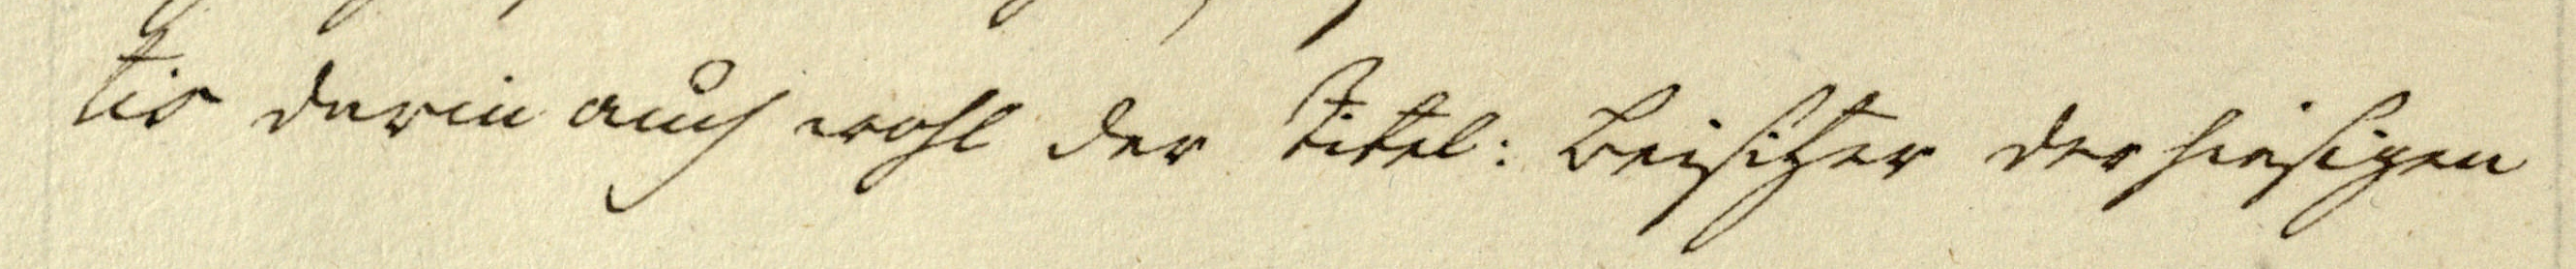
tis darin auch wohl der Titel: Beisitzer der hiesigen
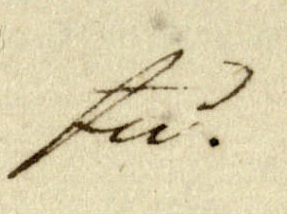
Ju.
